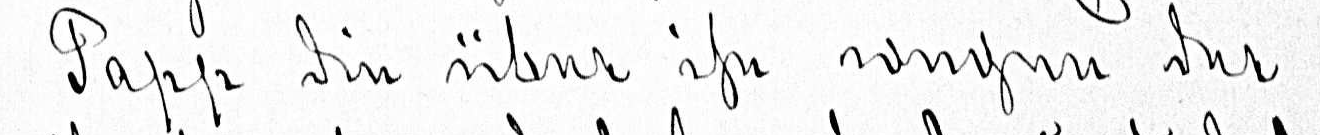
Papp die über ihn wegen der
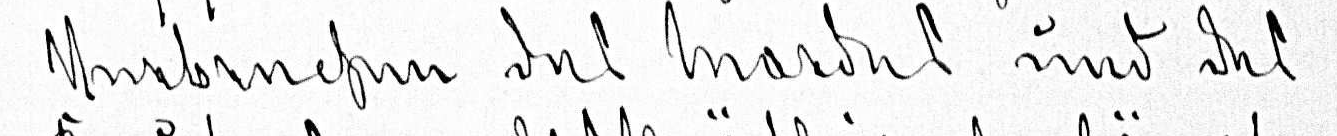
Verbrechen des Mordes und des
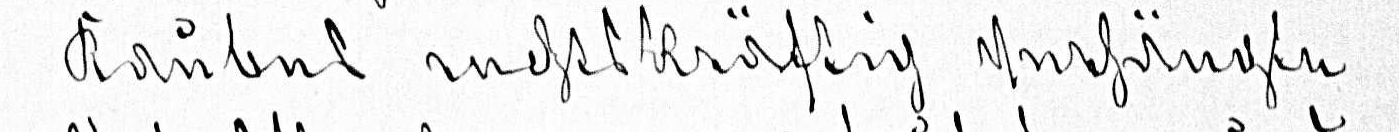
Raubes rechtkräftig verhängte
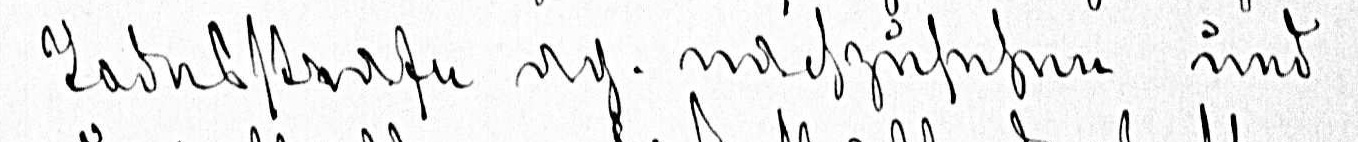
Todesstrafe ag. Nachzusehen und
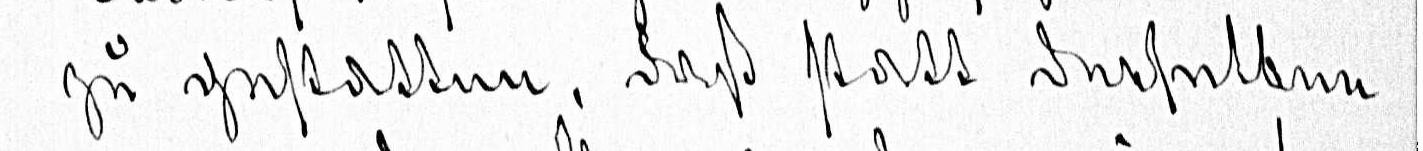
zu gestatten, daß statt denselben
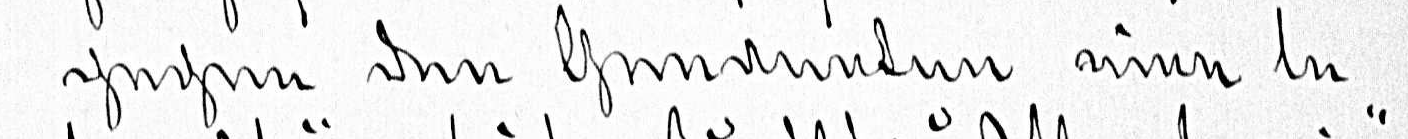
gegen den Genannten eine le¬
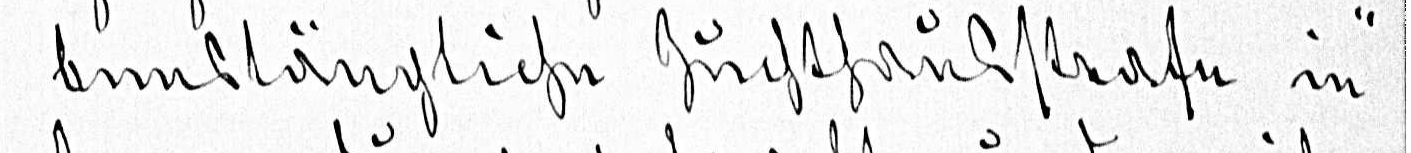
benslängliche Zuchthausstrafe in
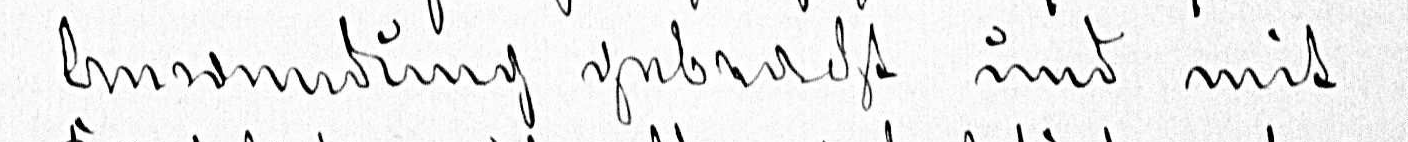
Anwendung gebracht und mit
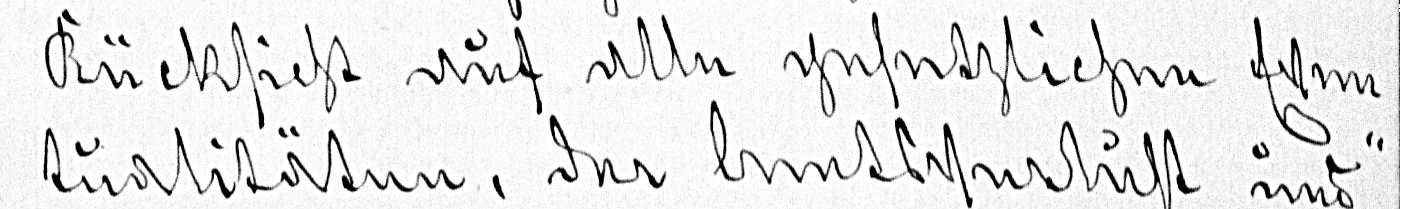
Rücksicht auf alle gesetzlichen Even¬
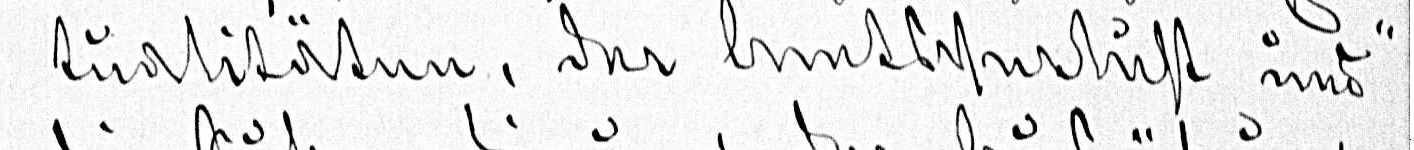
tualitäten, der Amtsverlust und
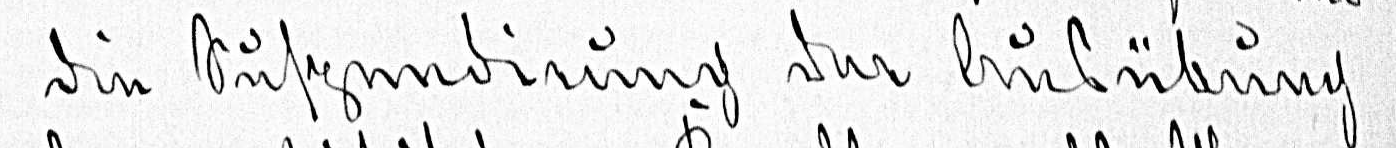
die Suspendirung der Ausübung
